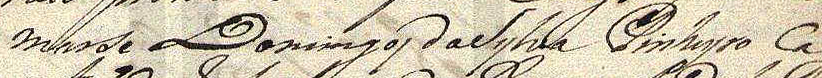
marse Domingos da Sylva Pinheyro Ca
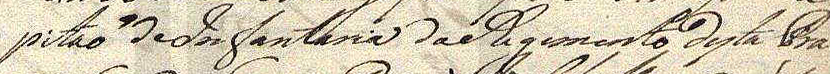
pitaõ de Infantaria da Regemento desta Pra
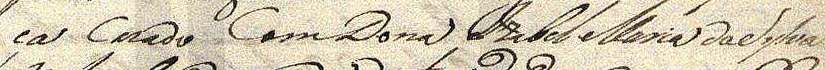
ça Cazado Com Dona Izabel Maria da Sylva
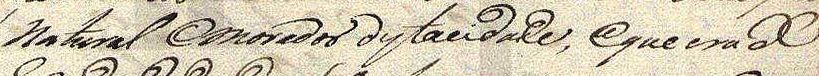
natural e morador desta cidade, e que era X
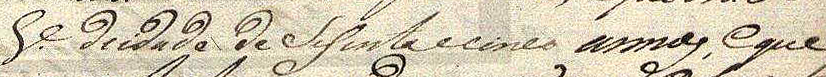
V. de idade de Sesenta e cinco annos, e que
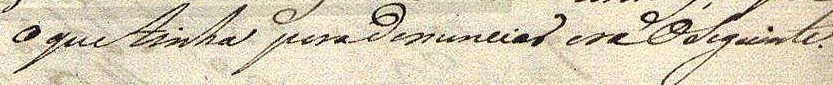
o que tinha pera denunciar era O Seguinte
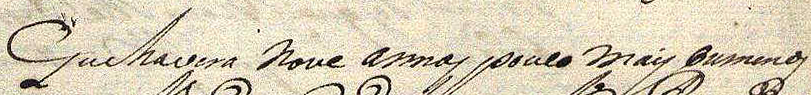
Que havera nove annos pouco mais ou menos
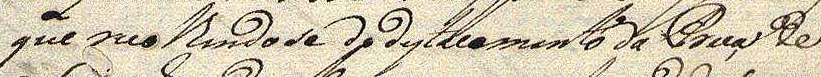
que recolhendo se do destacamento da Praça de
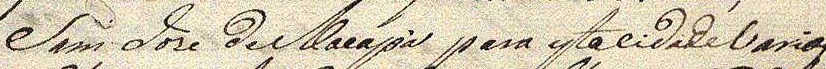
Sam Joze de Macapá para esta cidade varios
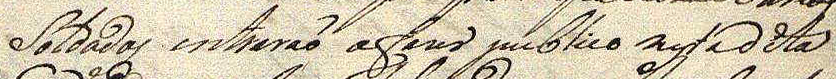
Soldados entraraõ a fazer publico nesta dita
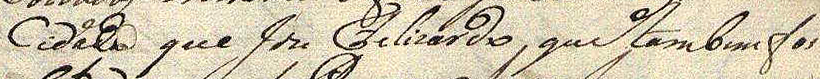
Cidade que Joze Felizardo, que tambem foi
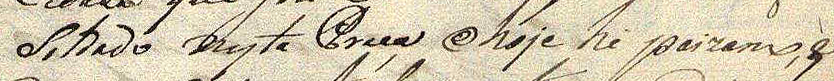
Soldado nesta Praça e hoje hé paizam, e
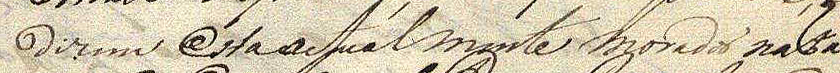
dizem esta actualmente morador na Fa
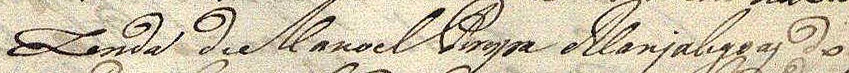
Zenda de Manoel Pereyra Manjalegoas do
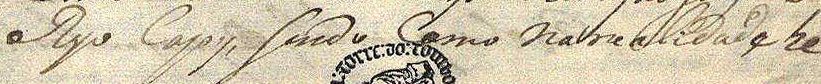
Ryo Capy, sendo Como na realidade he
